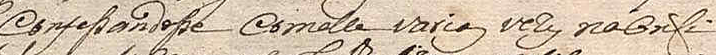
confessandosse com elle varias vezes na confi
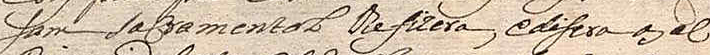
sam sacramental lhe fizera, e disera as ac
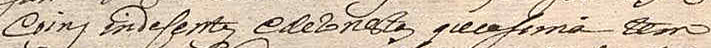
coins indeCentes, e dezonestas que asima tem
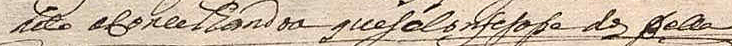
dito aconcelhandoa que se confesasse dos pecca
